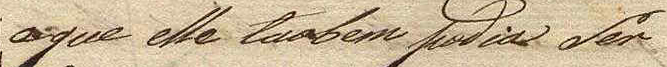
o que elle taobem podia ser
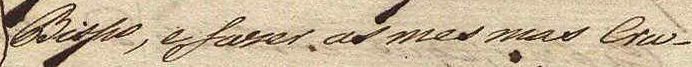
Bispo, e fazer as mesmas Cru
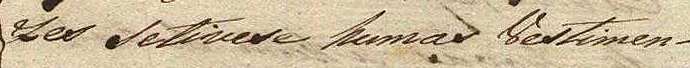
zes se tivese humas Vestimen
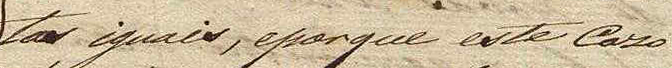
tas iguais, e porque este cazo
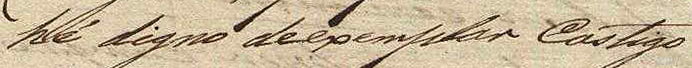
hé digno de exemplar Castigo
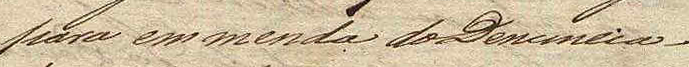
para emmenda do Denuncia
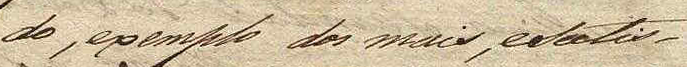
do, exemplo dos mais, e satis
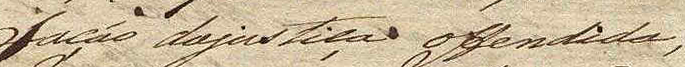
fação da justiça offendida,
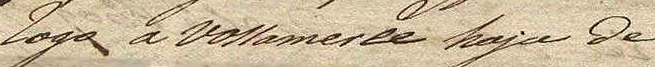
logo a vossa merce haja de
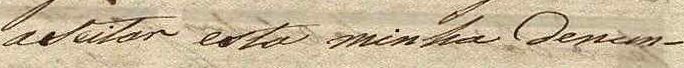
aseitar esta minha denun
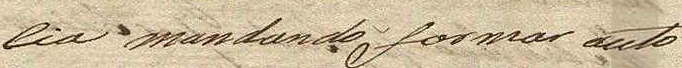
cia mandando formar auto
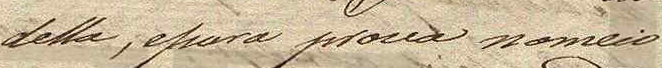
della, e para proua nomeio
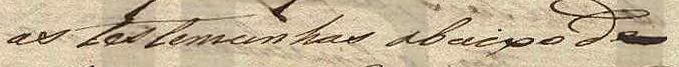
as testemunhas abaixo de
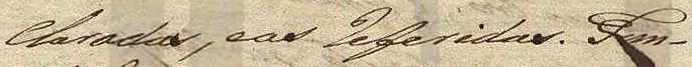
claradas, e as Referidas. Fun
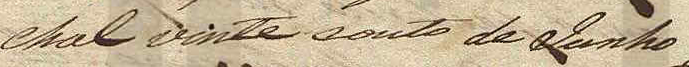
chal vinte e outo de Iunho
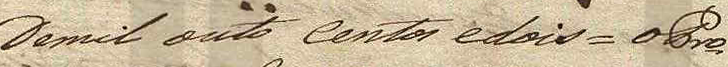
de mil outocentos e dois = o Pro
